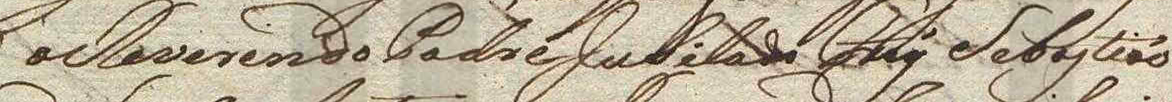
o Reverendo Padre Jubilado Frey Sebastiaõ
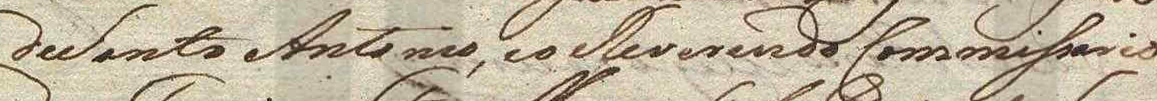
de Santo Antonio, e o Reverendo Commissario
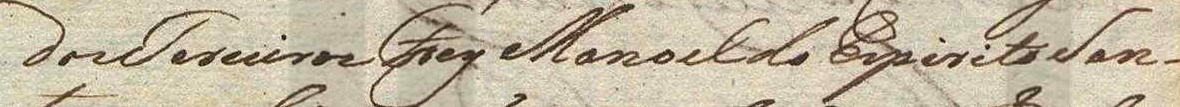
dos Terceiros Frey Manoel do Espirito San
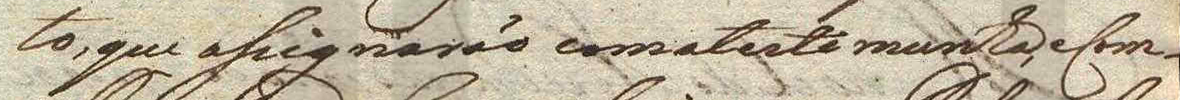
to, que assignaraõ com a testemunha, e Com
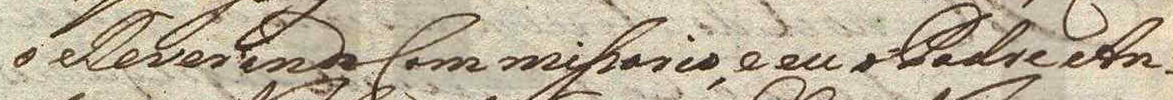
o Reverendo Commissario, e eu o Padre An
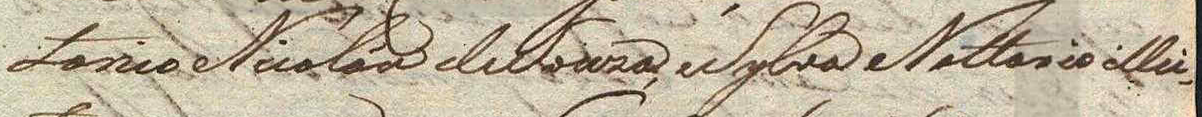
tonio Nicoláu de Souza, e Sylva Nottario illei
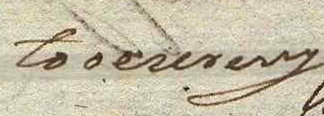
to o escrevy
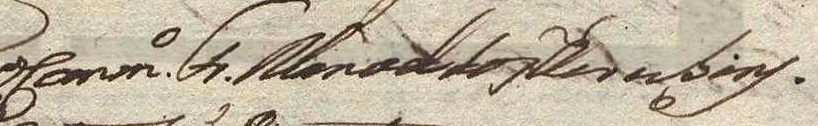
O Comm.o Fr. Manael dos Qerosbins
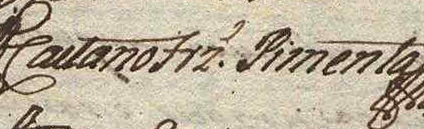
Caetano frz̄ Pimenta
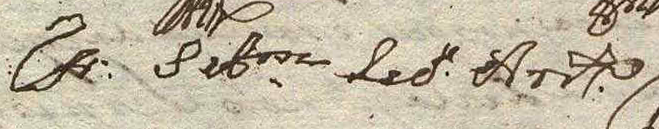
Fr. Seb.m de s.to Ant.o
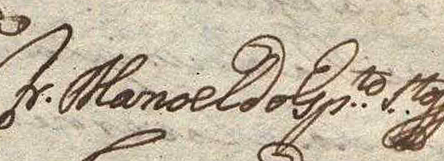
Fr. Manoel do Esp.to s.to
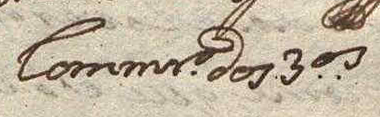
Commr.o dos 3.os
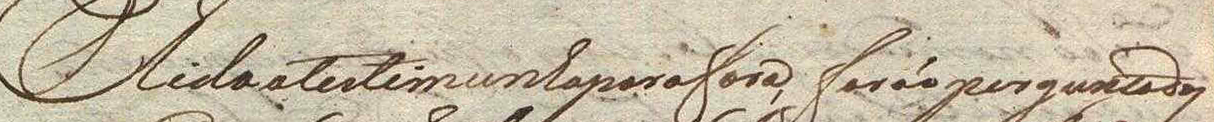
E hida a testimunha para fora, foraõ perguntados
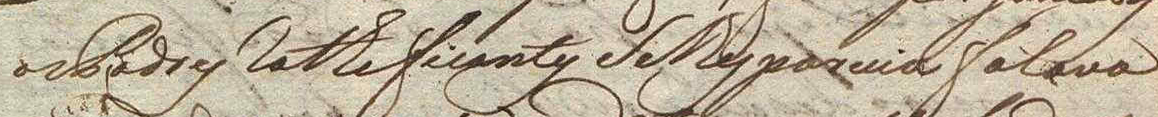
os Padres Ratheficantes se lhes parecia falava
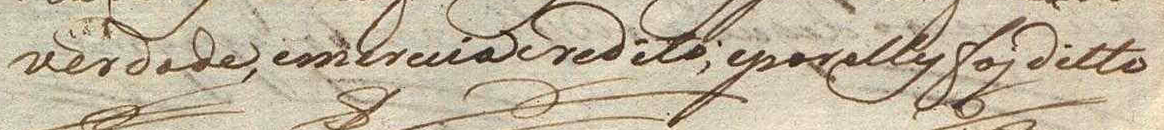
verdade, e merecia credito; e por elles foj ditto
